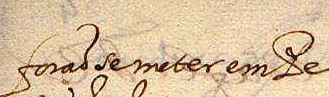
foraõ se meter em Pe
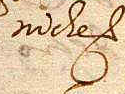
niche
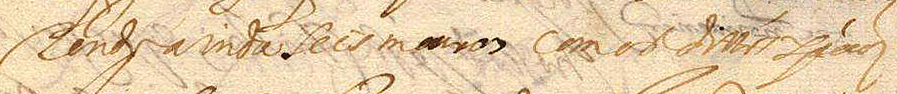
zendo ainda seis mouros com os dittos xpãos
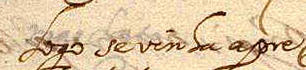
Logo se vinha aprez
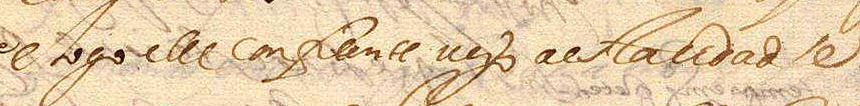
e logo elle confitente ueyo a esta cidade
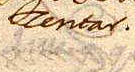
zentar.
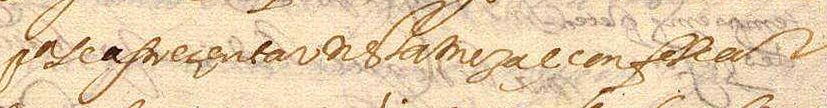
pa se aprezentar nesta meza e confessar
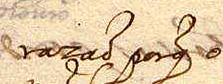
razaõ porq̄ o
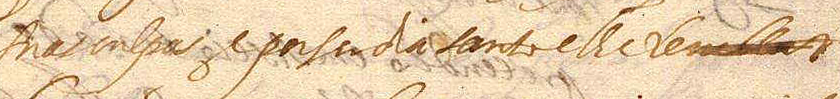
suas culpas e por ser dia santo e lhe reuellar
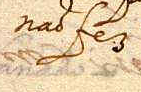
naõ fez
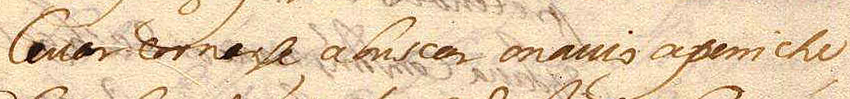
leuar tornarse a buscar o nauio a peniche
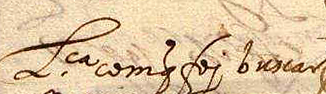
L.ça com q̄ foj buscar
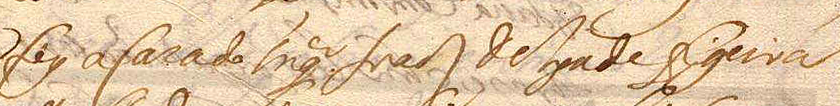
foy a Caza do Inq.or Joaõ delgado figeira
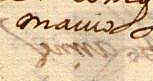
o nauio
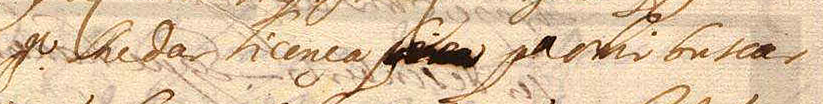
pa. lhe dar licença _ pa o hir buscar
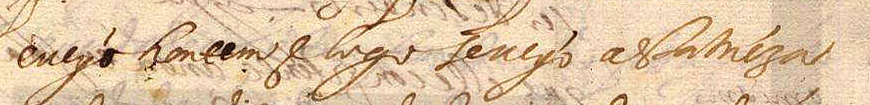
e ueyo hontem e logo se ueyo a esta meza
